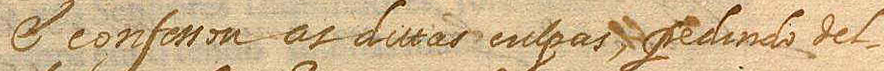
& confessou as dittas culpas, pedindo del
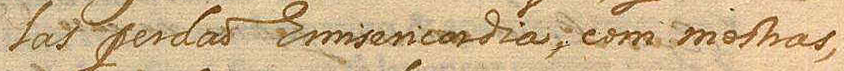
las perdaõ E misericordia, com mostras,
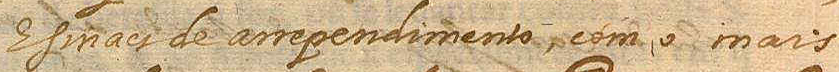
E sinaes de arrependimento, com, o mais
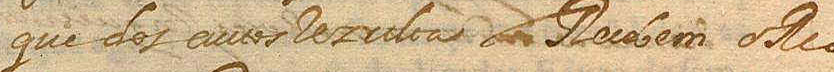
que dos autos rezulta Recebem o Reo
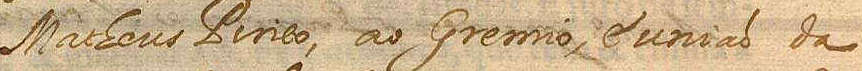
Matheus Pinto, ao Gremio, & uniaõ da
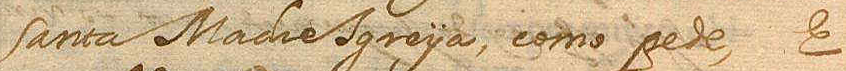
Santa Madre Igreya, como pede, E
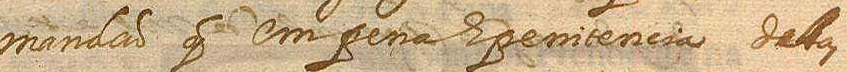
mandaõ q̄ em pena E penitencia della,
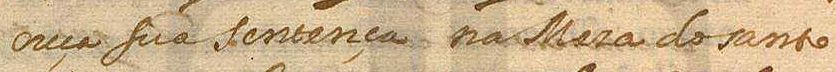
ouça sua sentença na Meza do santo
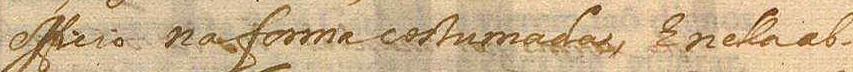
officio na forma costumada, E nella ab
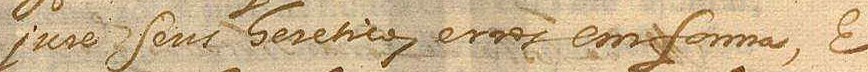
jure seus hereticos erros em forma, E
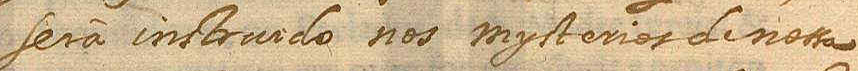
será instruido nos mysterios de nossa
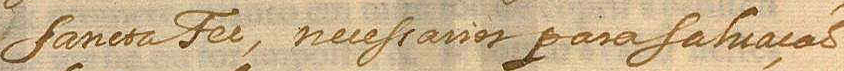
Sancta Fee, necessarios para saluaçaõ
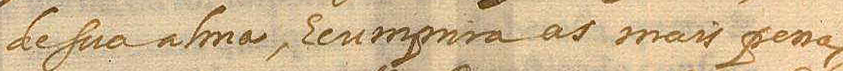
de sua alma, E cumprira as mais penas
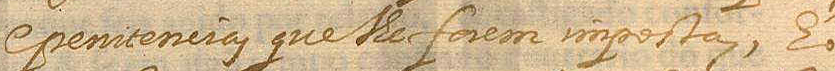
E penitencias que lhe forem impostas, E o
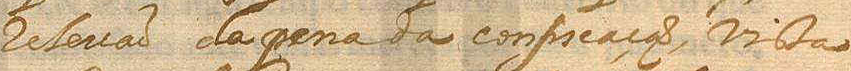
Releuaõ da pena da confiscaçaõ, vista
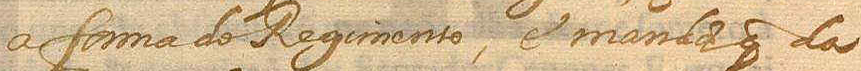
a forma do Regimento, e mandaõ q̄ da
